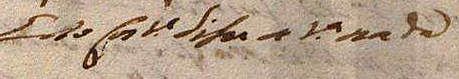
E do Cost.e disse a t.a nada
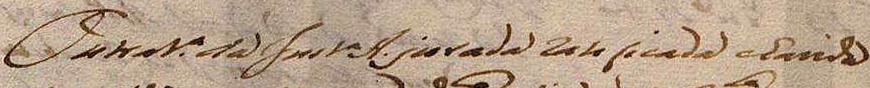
Outra t.a da Just.a A. jurada Rateficada, e hauida
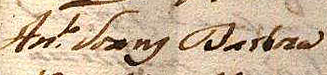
An.to Soares Barboza
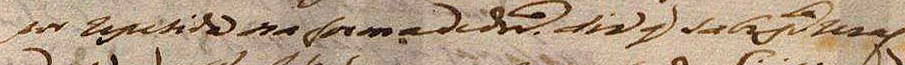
por repetida na forma de dr.to diz q̄ sabe pla rezaꝭ
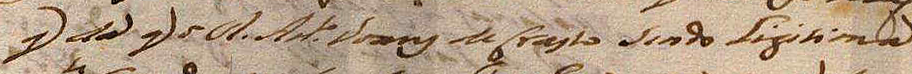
q̄ da q̄ o R. Ant.o Soares de Crasto sendo Ligitima
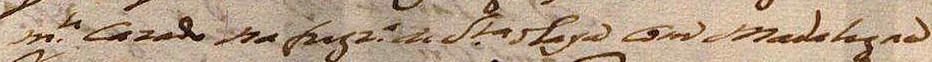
m.te cazado na fregz.a da S.ta olaya com madalegna
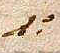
d.o
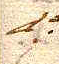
d.o
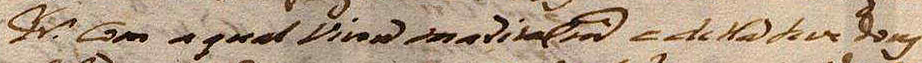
Pr.a com a qual viveu maritalmte e della teve dous
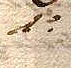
d.o
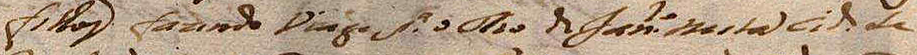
filhos fazendo viage p.a o Rio de Jan.ro nesta cid.e se
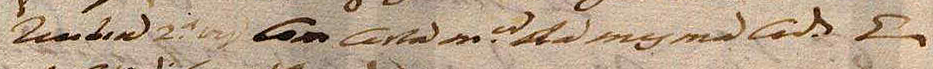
Recebeu 2.a ves Com certa m.er da mesma Cid.e E
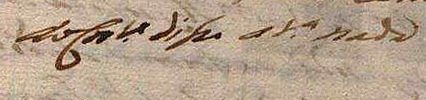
do Cost.e disse a t.a nada
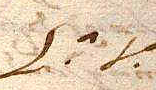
1.a t.a
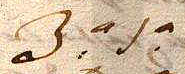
3.a t.a
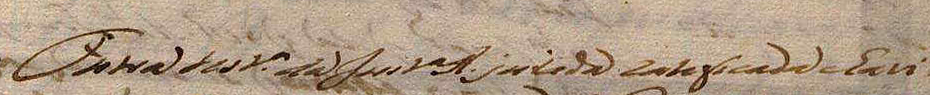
Outra test.a da Justa A. jurada rateficada e haui
